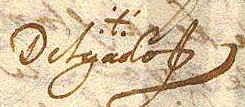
Delgado
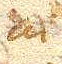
ui
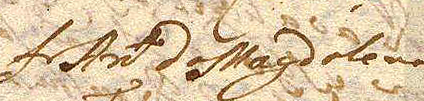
fr Anto da Magdalena
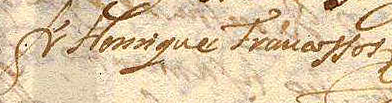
fr Henrique Trauassos
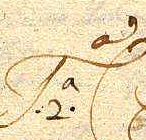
T.a 2.a
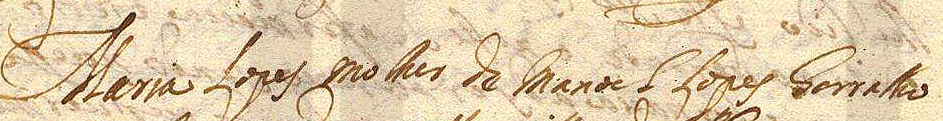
Maria Lopes molher de Manoel Lopes Borralho
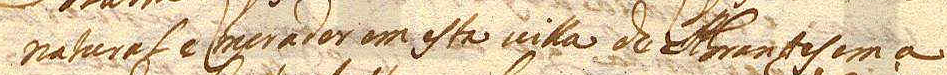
natural e morador em esta uilla de Abrantes em a
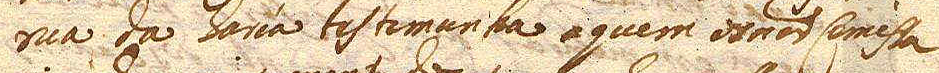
rua da barca testemunha a quem o snor̄ Comissa
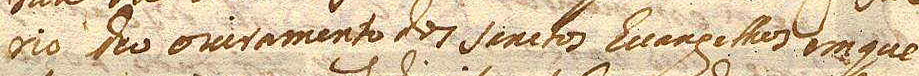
rio deu o iuramento dos sanctos Euangelhos em que
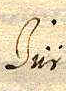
Jur
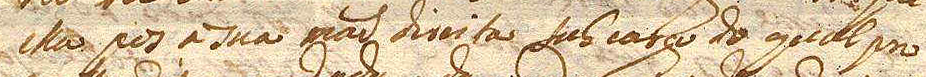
ella pos a sua maõ direita sub cargo do qual pro
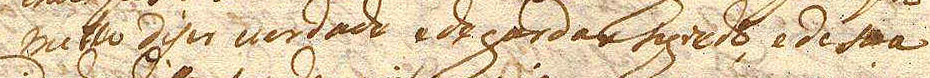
meteo diser uerdade e de gordar segredo, e de sua
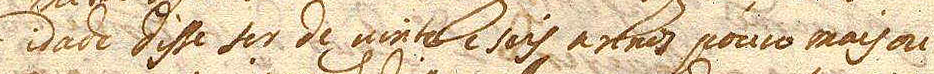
idade disse ser de uinte e seis annos pouco mais ou
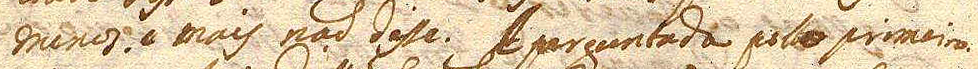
menos, e mais naõ disse. E perguntada pello primeiro.
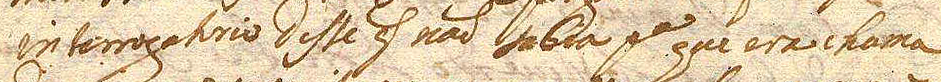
interrogatorio disse q̄ naõ sabia pa que era chama
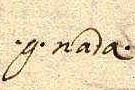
g. nada.
